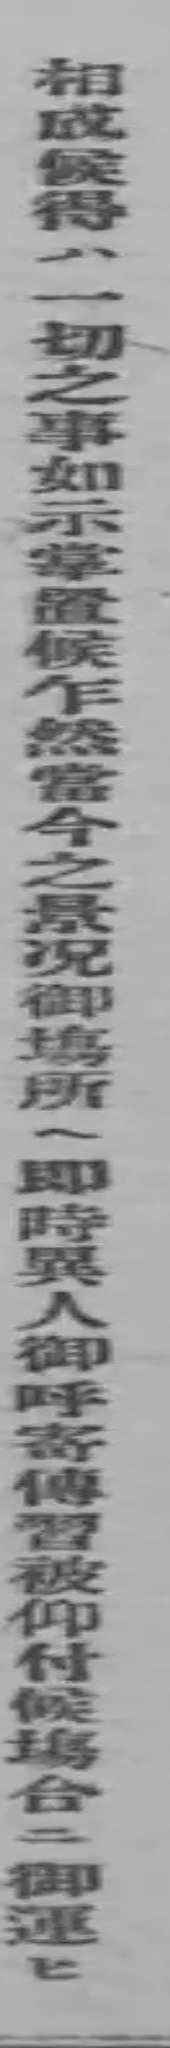相成候得ハ一切之事如示掌置候乍然当今之景況御場所へ即時異人御呼寄伝習被仰付候場合ニ御運ヒ
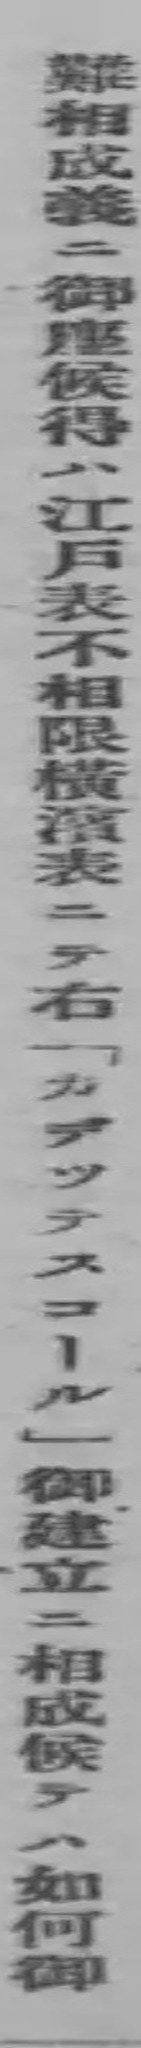難相成義ニ御座候得ハ江戸表不相限横浜表ニテ右「カデツテスコール」御建立ニ相成候テハ如何御
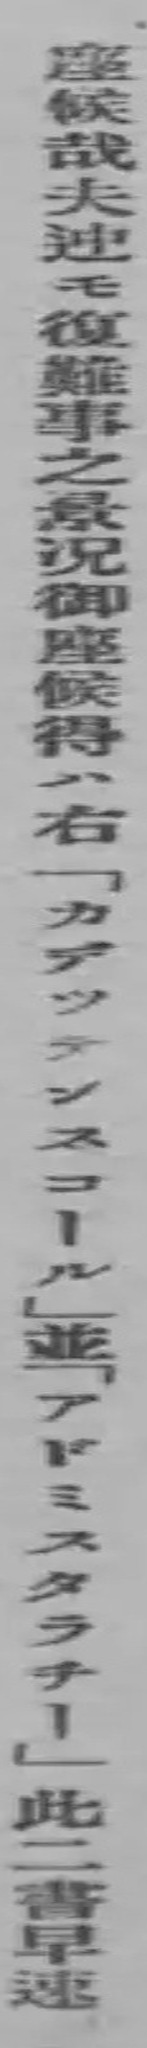座候哉夫迚モ復難事之景況御座候得ハ右「カデツテンスコール」並「アドミスタラチー」此二書早速
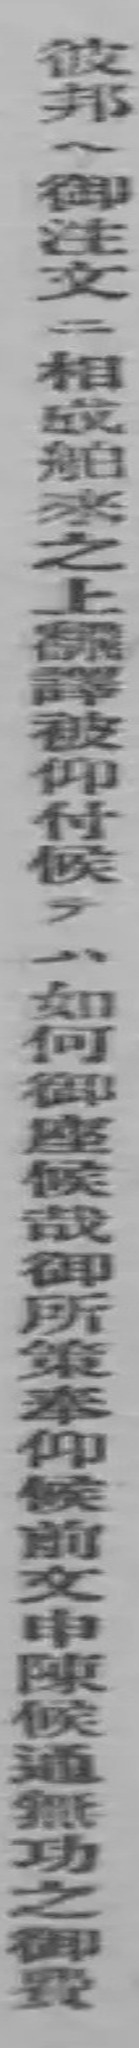彼邦へ御注文ニ相成舶来之上翻訳被被仰付候テハ如何御座候哉御所策奉仰候前文申陳候通無功之御費
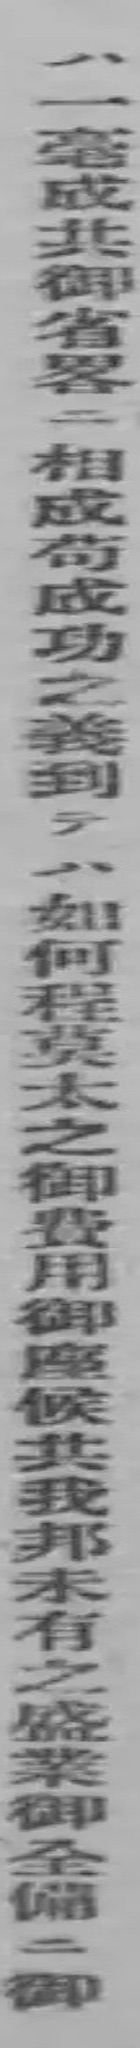ハ一毫成共御省略ニ相成苟成功之義到テハ如何程莫太之御費用御座候共我邦未有之盛業御全備ニ御
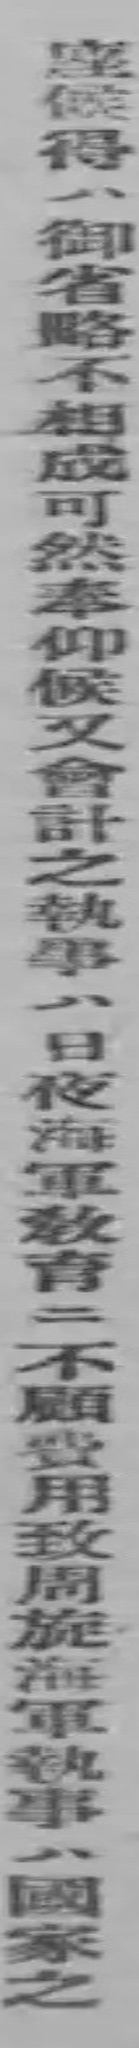座候得ハ御省略不相成可然奉仰候又会計之執事ハ日夜海軍教育ニ不顧費用致周旋海軍執事ハ国家之
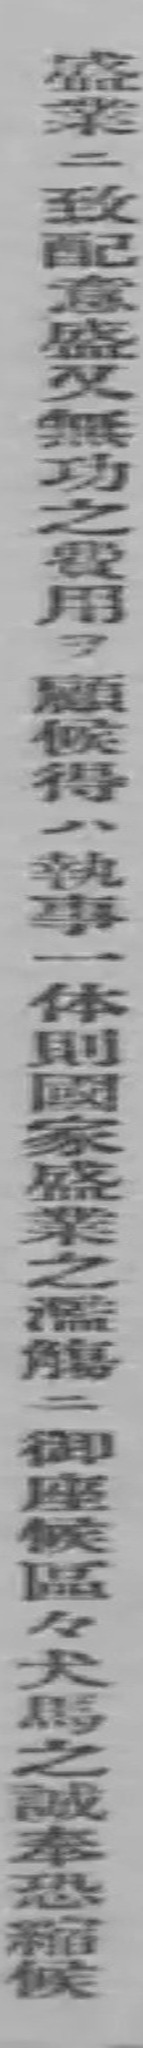盛業ニ致配意盛又無功之費用ヲ顧候得ハ執事一体則国家盛業之濫觴ニ御座候区々犬馬之誠奉恐縮候
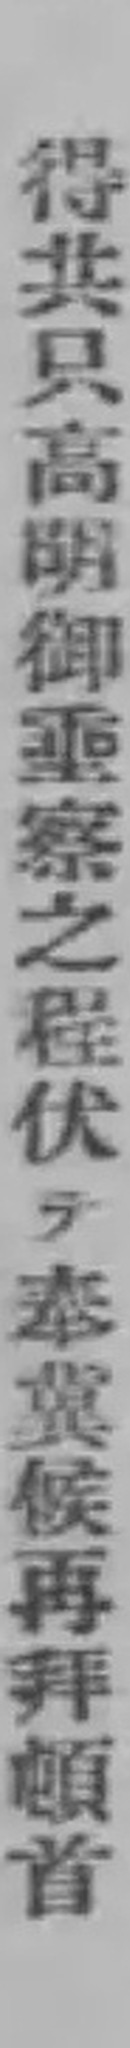得共只高明御垂察之程伏テ奉冀候再拝頓首
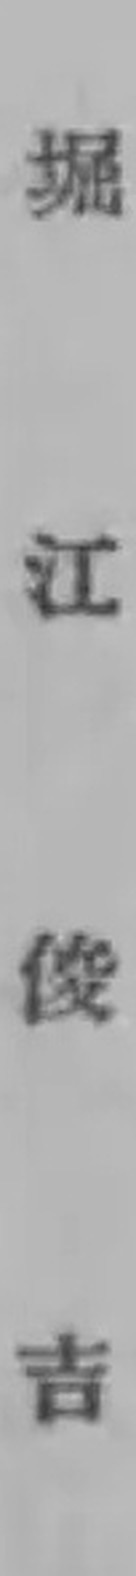堀江俊吉
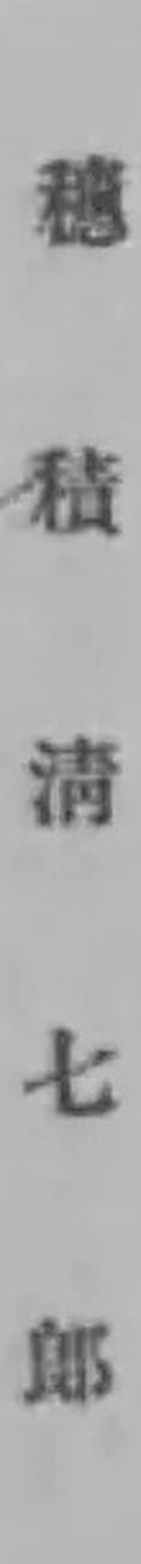穂積清七郎
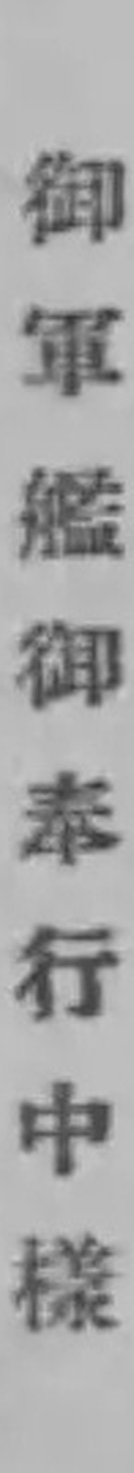御軍艦奉行中様
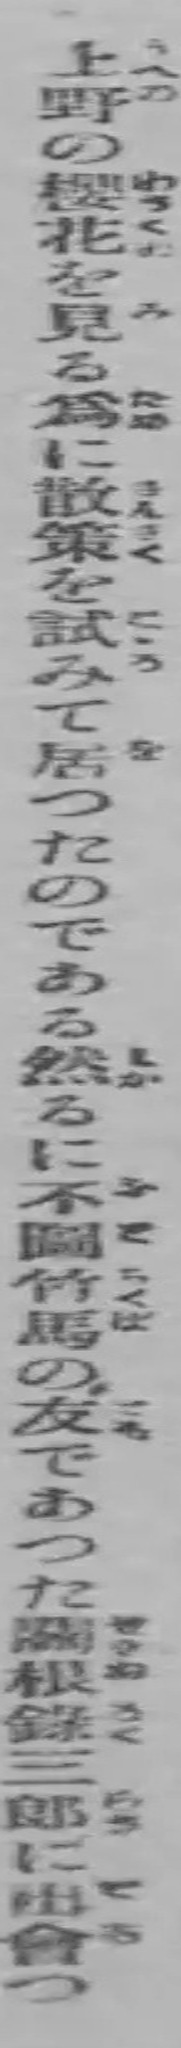上野の桜花を見る為に散策を試みて居つたのである然るに不図竹馬の友であつた関根録三郎に出会つ
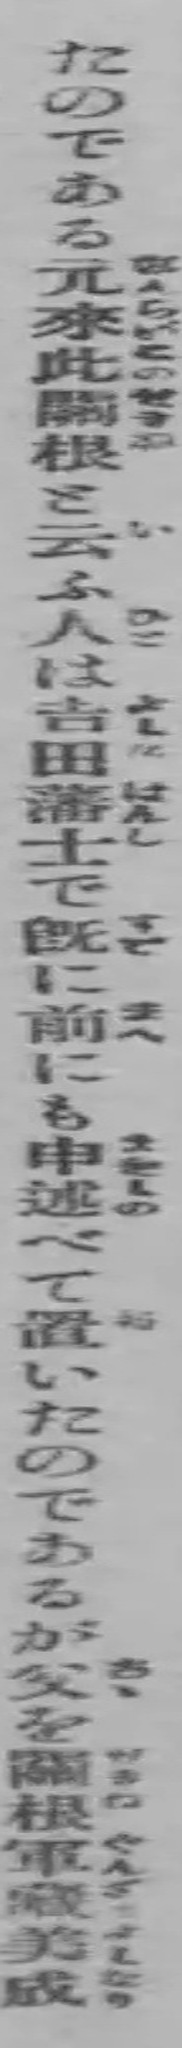たのである元来此関根と云ふ人は吉田藩士で既に前にも申述べて置いたのであるが父を関根軍蔵美成
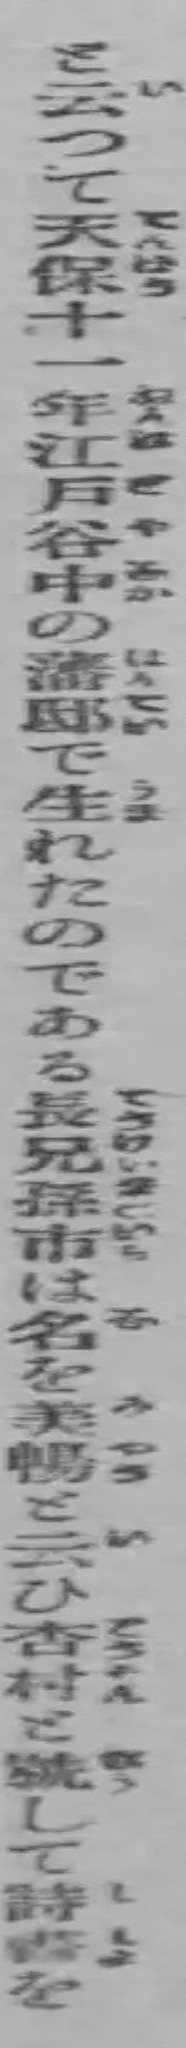と云つて天保十一年江戸谷中の藩邸で生れたのである長兄孫市は名を美暢と云ひ杏村と号して詩書を
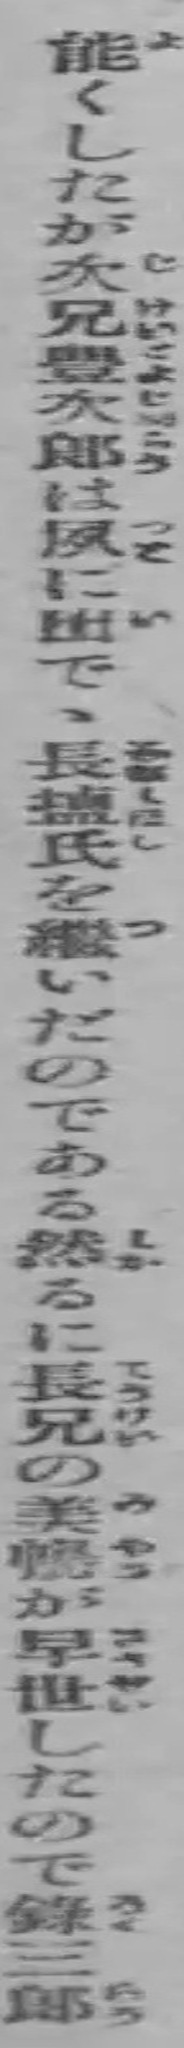能くしたが次兄豊次郎は夙に出でゝ長塩氏を継いだのである然るに長兄の美暢が早世したので録三郎

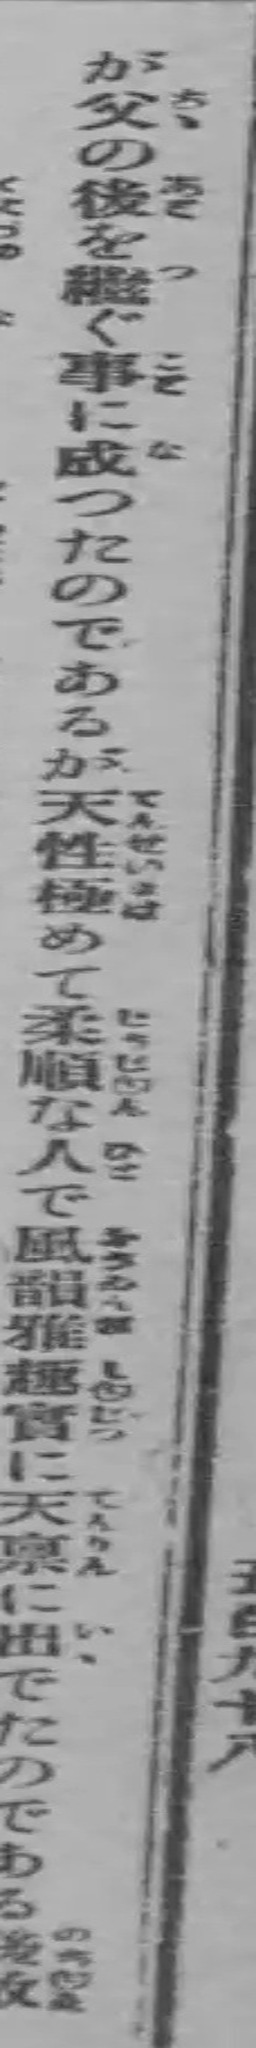が父の後を継ぐ事に成つたのであるが天性極めて柔順な人で風韻雅趣実に天稟に出でたのである後故
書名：豊橋市史談
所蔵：国立国会図書館 National Diet Library, JAPAN
